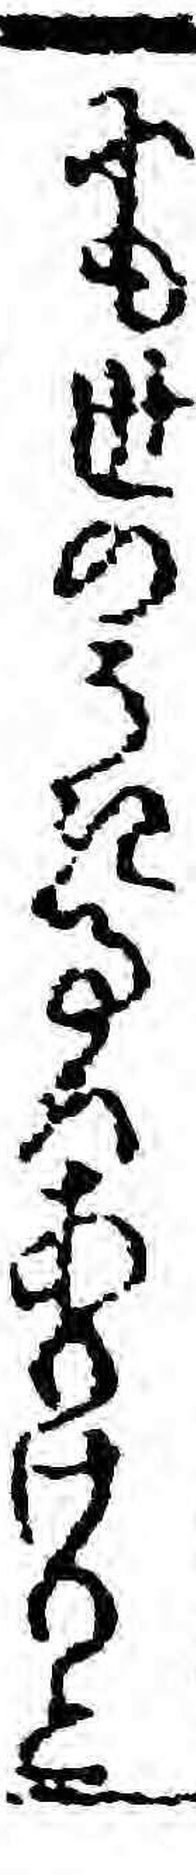にも世のうき事はありけりと
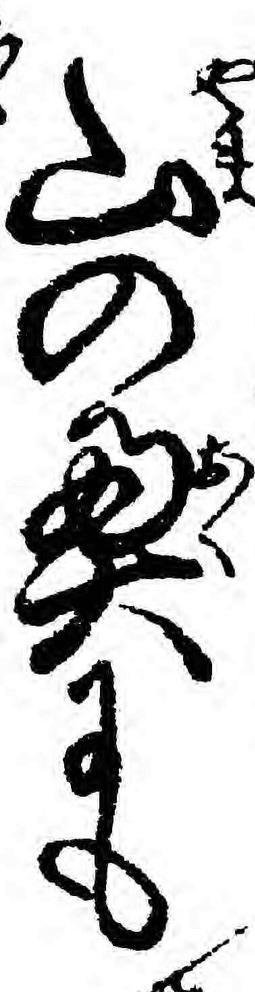山の奥にも
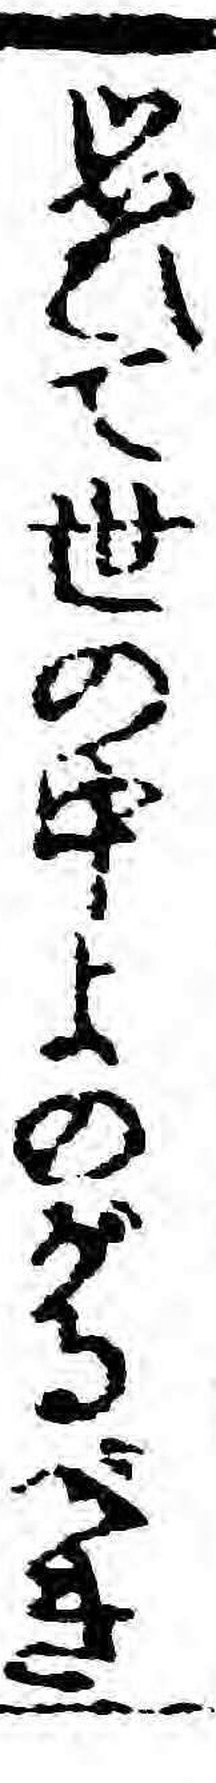思ひて世の中よのがるべき
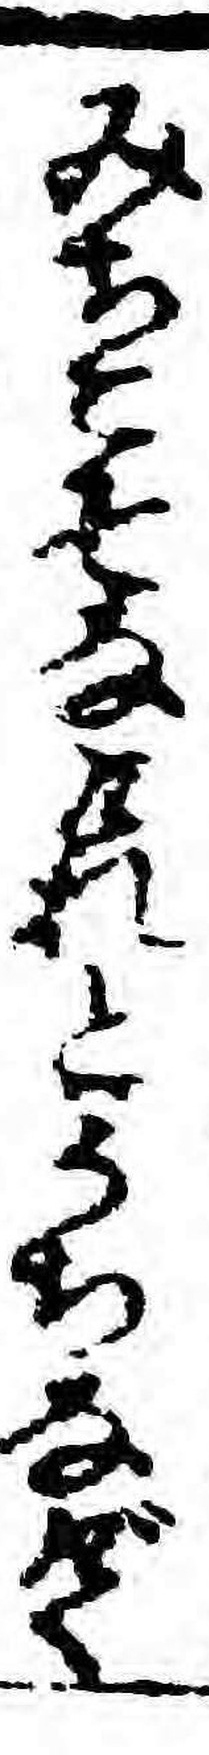みちこそなけれとうちなげく
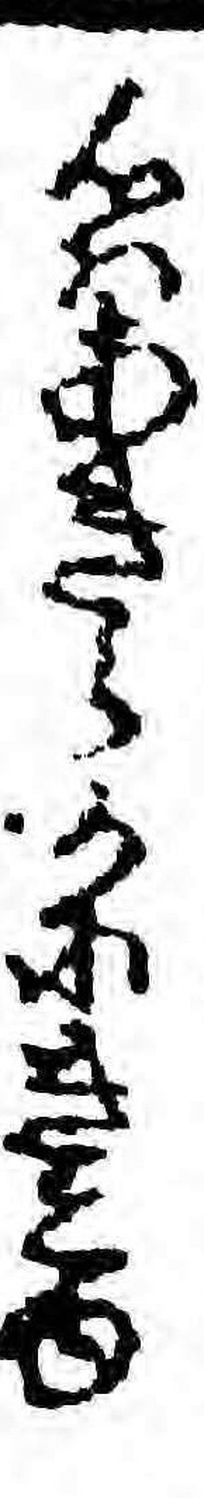心はあきらかにきこゆ
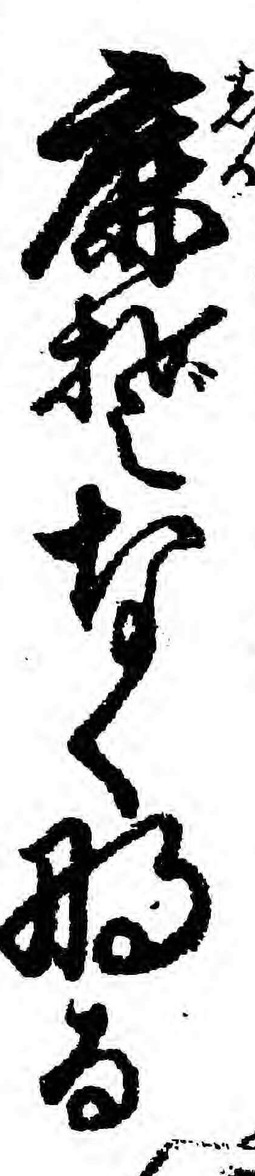鹿ぞなくなる

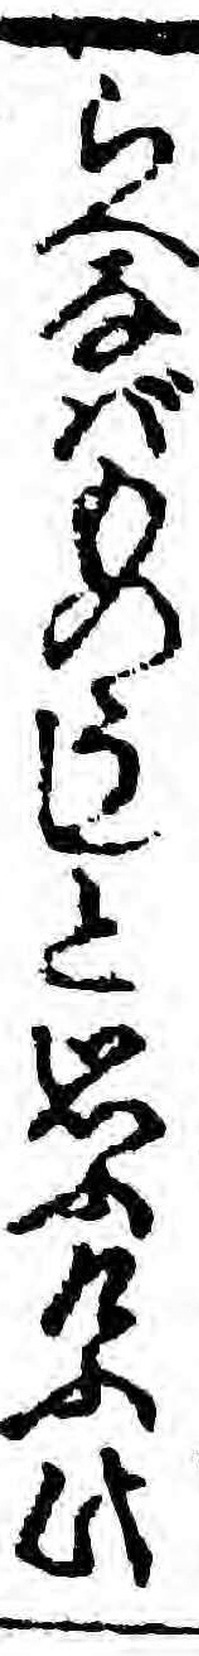らへなばものうしと思ふけふ此
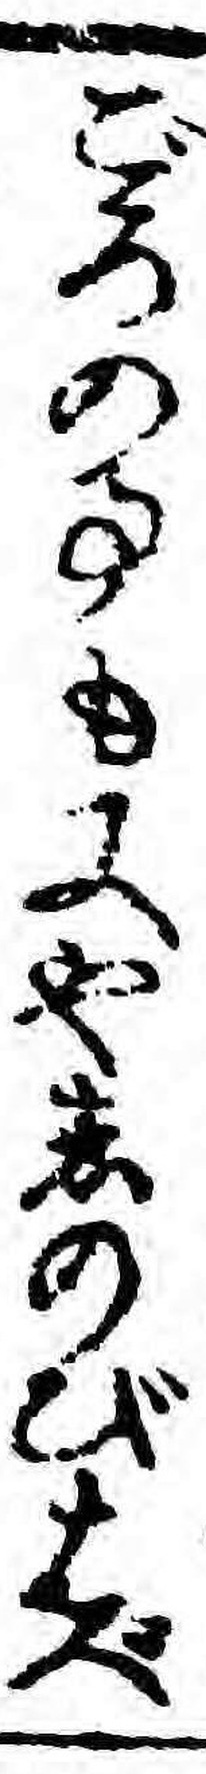ごろの事も又やしのびはべ
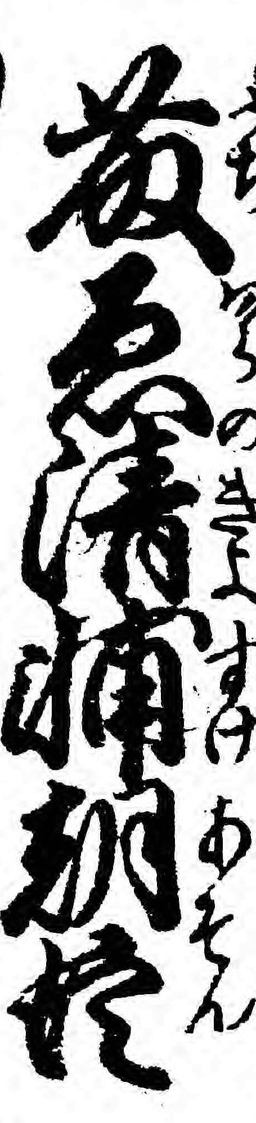藤原清輔朝臣
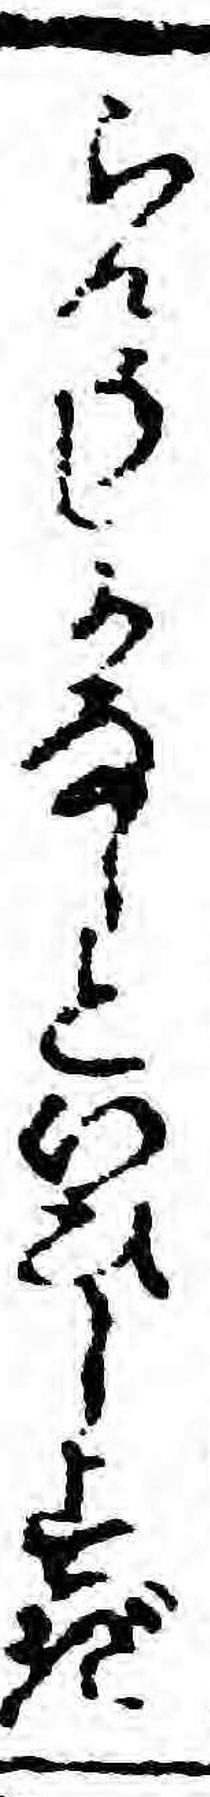らんうしかなしといひしすぎ
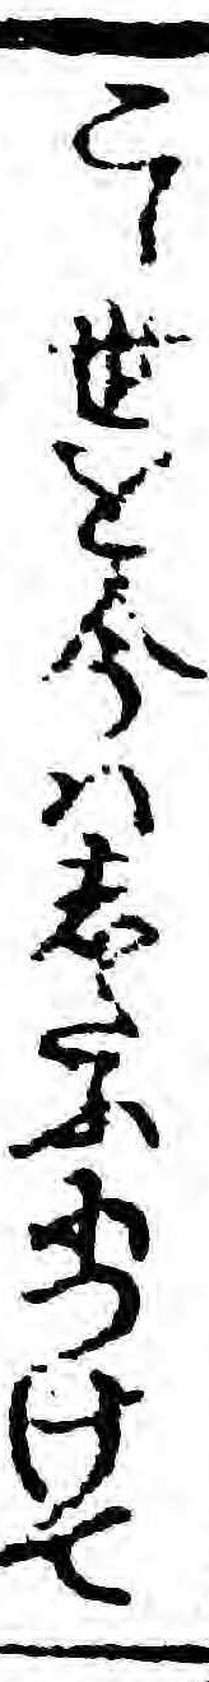たし世を今はしたふにつけて
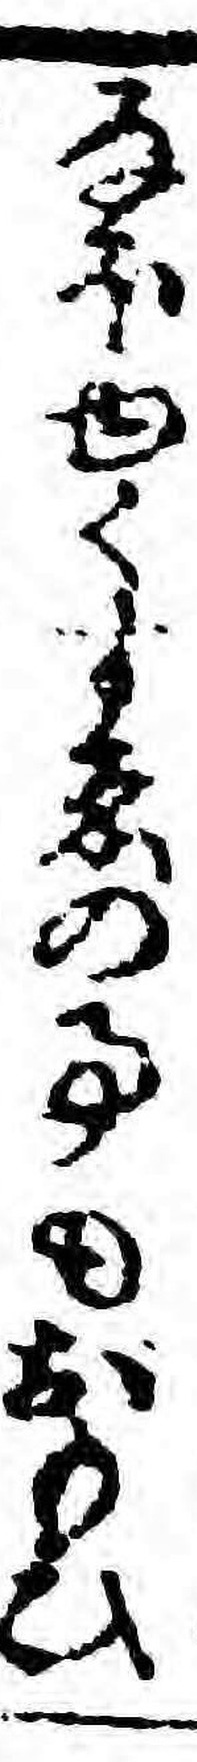なほゆくすゑの事もおもひ
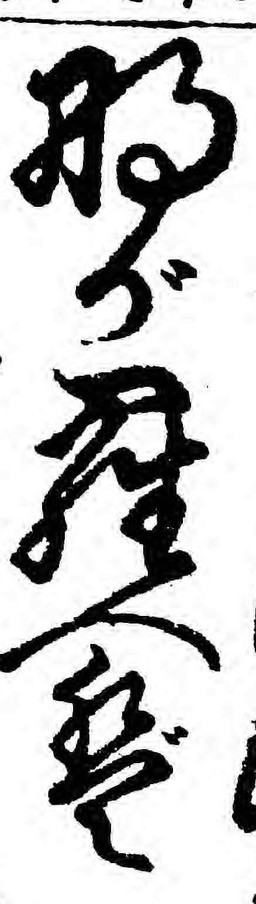ながらへば
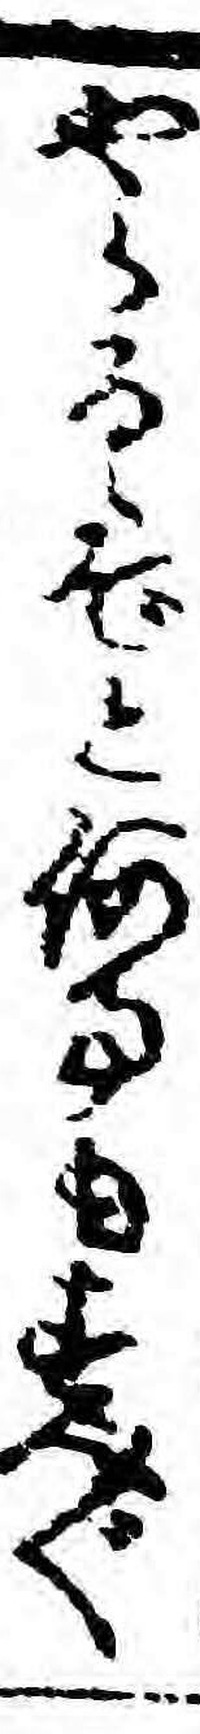やらるゝぞと何事もすへ〴〵
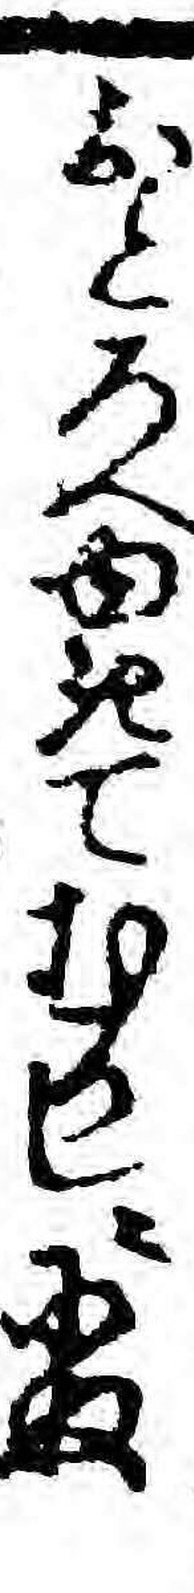おとろへゆきてむかしににぬ
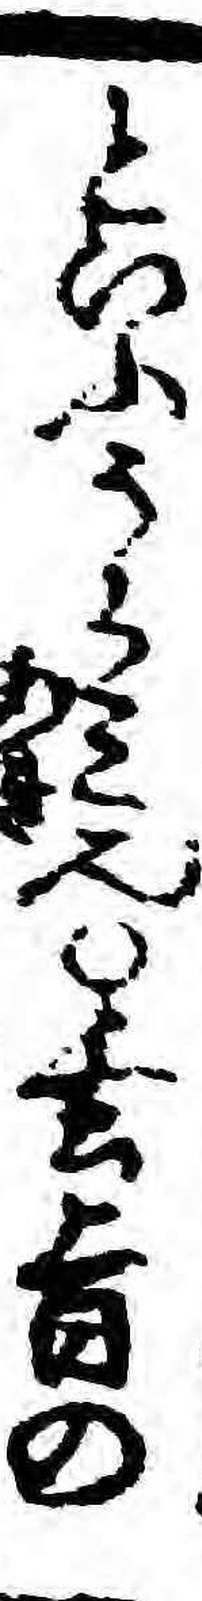といふうらみ也〇玄旨の
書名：頭書和歌注譯／壽賀多百人一首小倉錦
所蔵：国文学研究資料館
